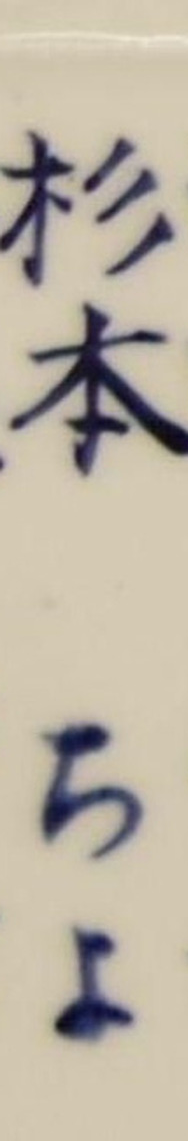杉本ちよ
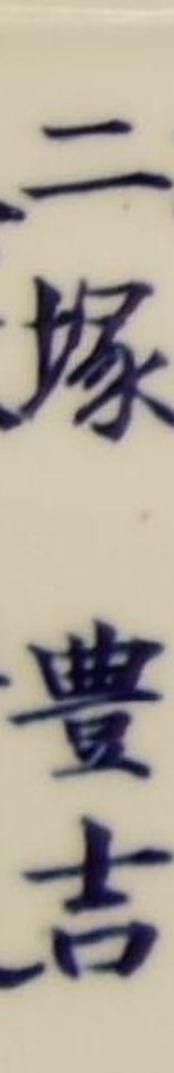二塚豊吉
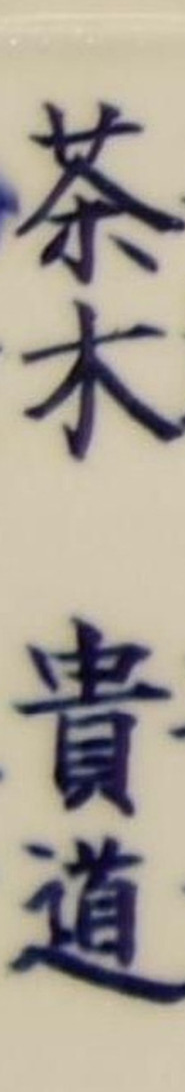茶木貴道
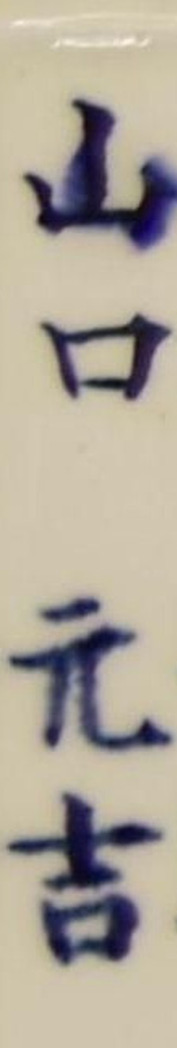山口元吉

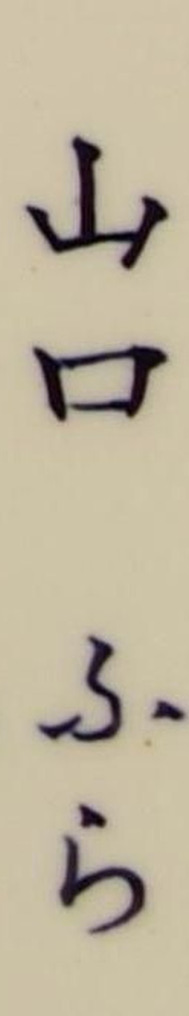山口ふら
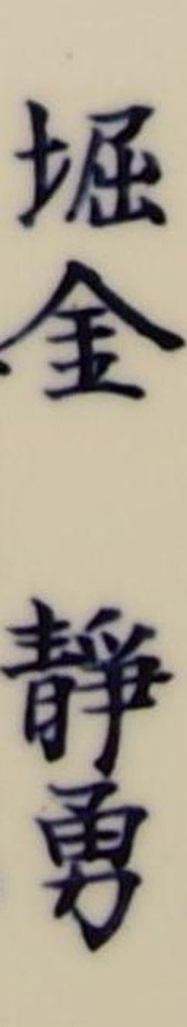堀金静勇
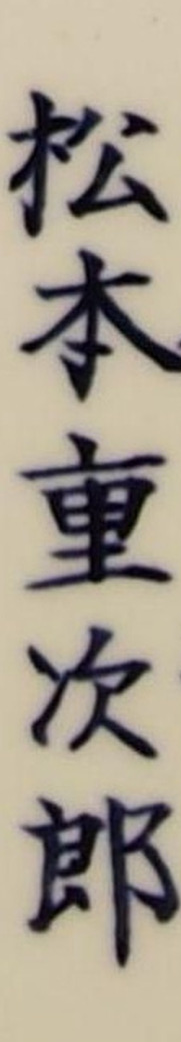松本重次郎
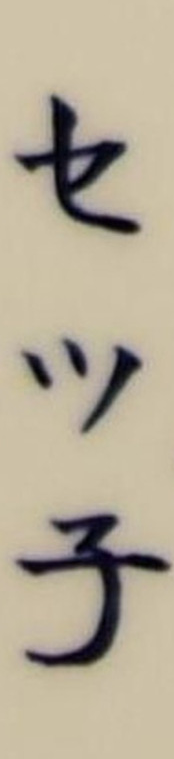セツ子
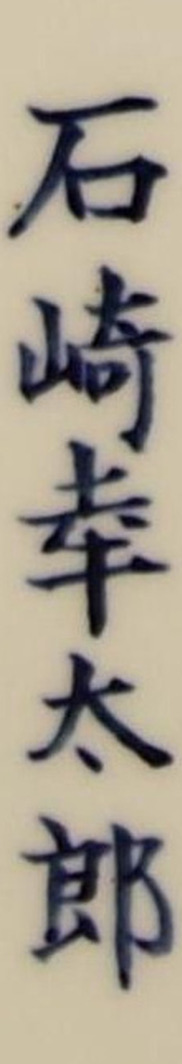石崎幸太郎
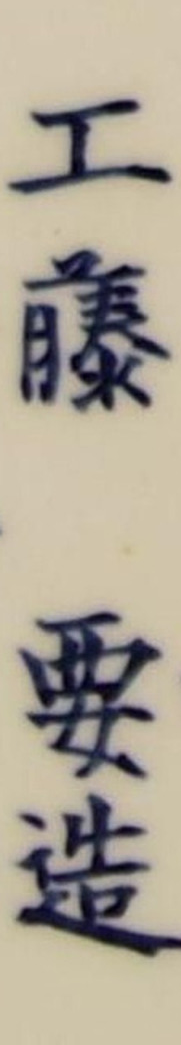工藤要造
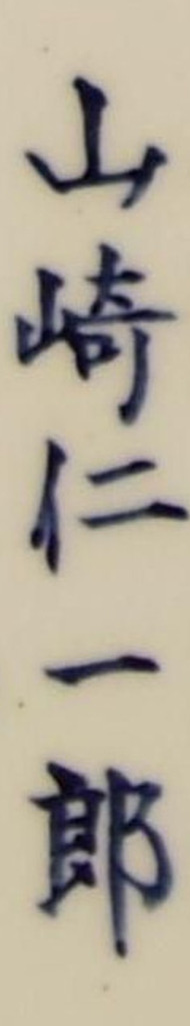山崎仁一郎
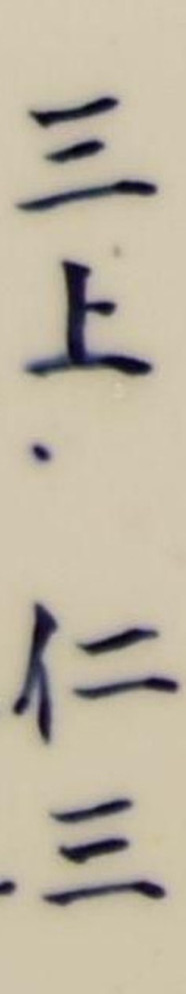三上仁三
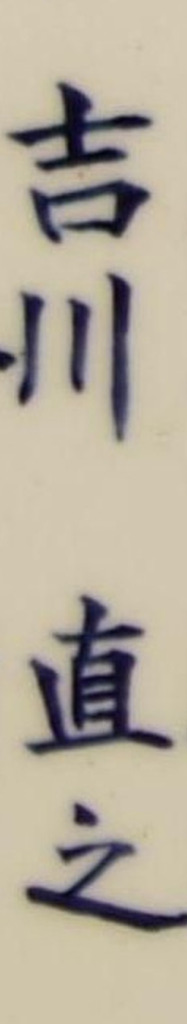吉川直之
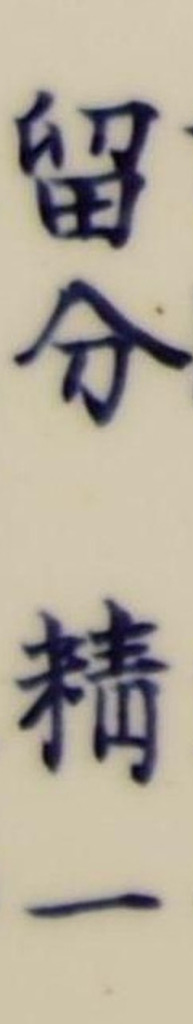留分精一
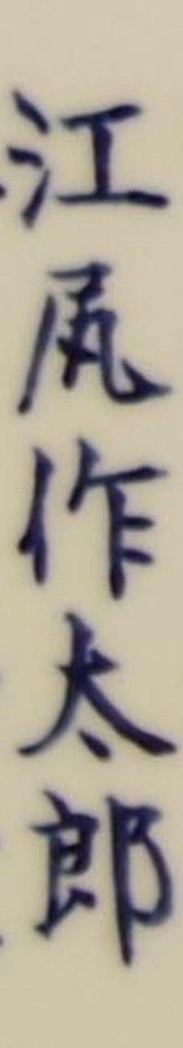江尻作太郎
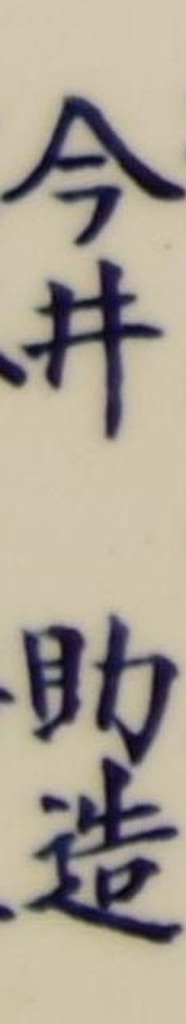今井助造
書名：A~D
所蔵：koyasan kongobuji
